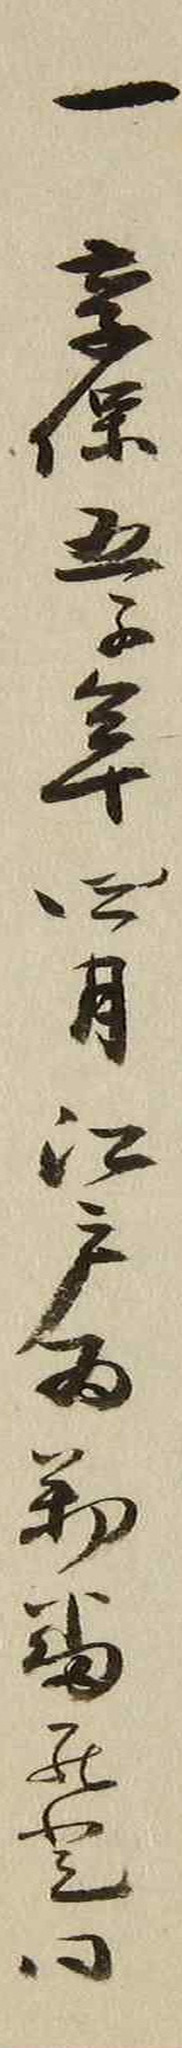一享保五子年四月江戸為勤番罷登同
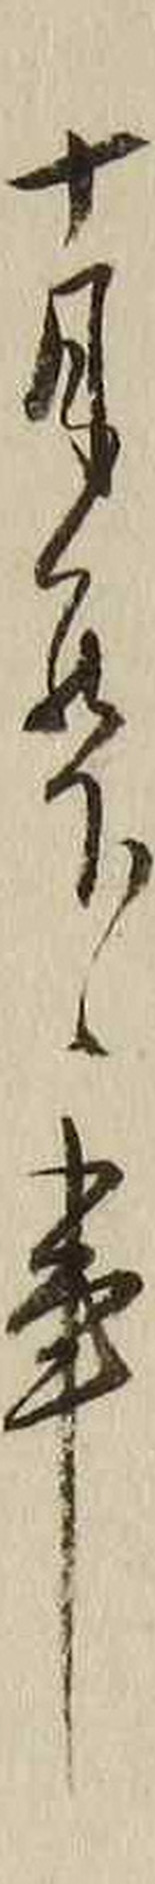十月罷下候事
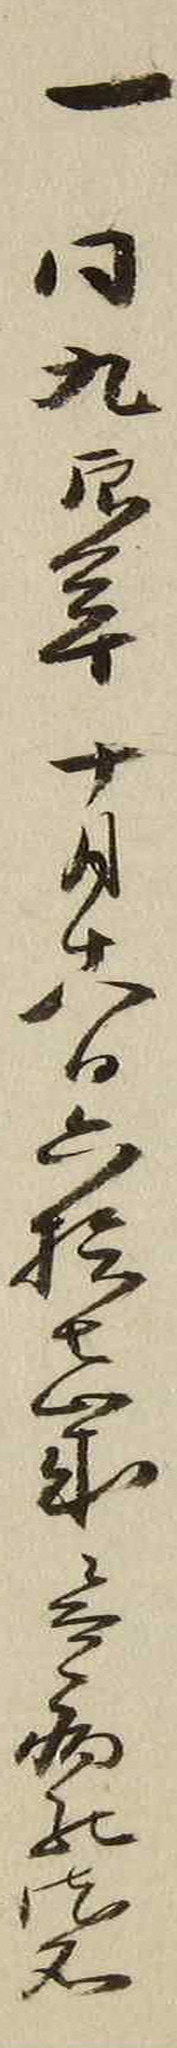一同九辰年十月十八日六拾七歳ニ而病死法名
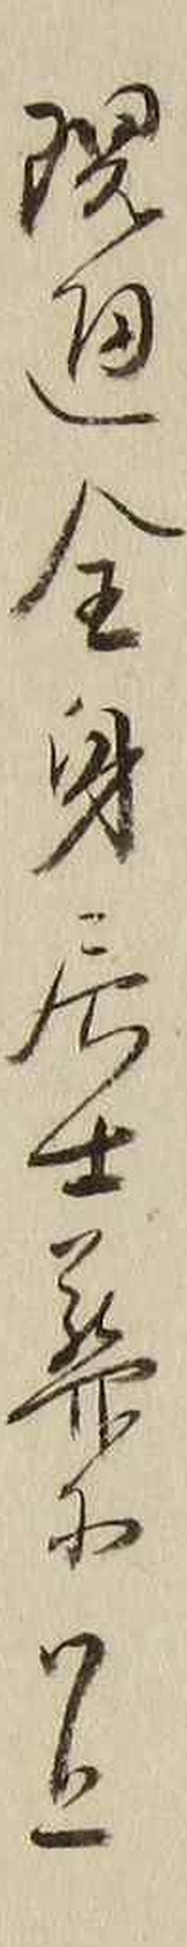現通全身居士葬所同上
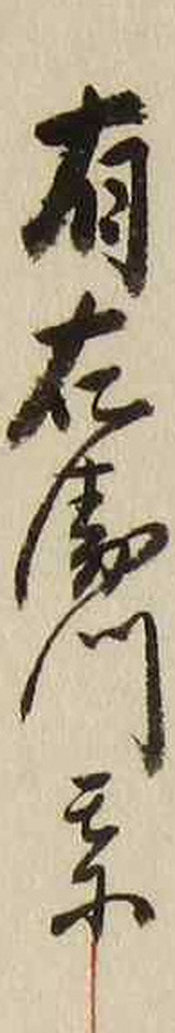有右衛門某
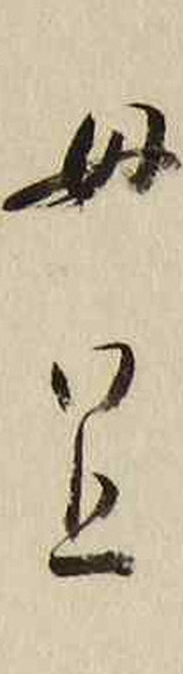母同上

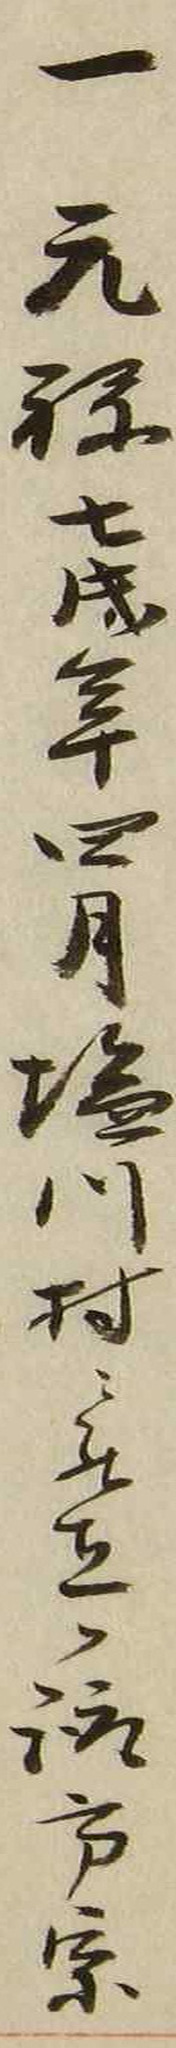一元禄七戌年四月塩川村ニ罷在候諏方宗
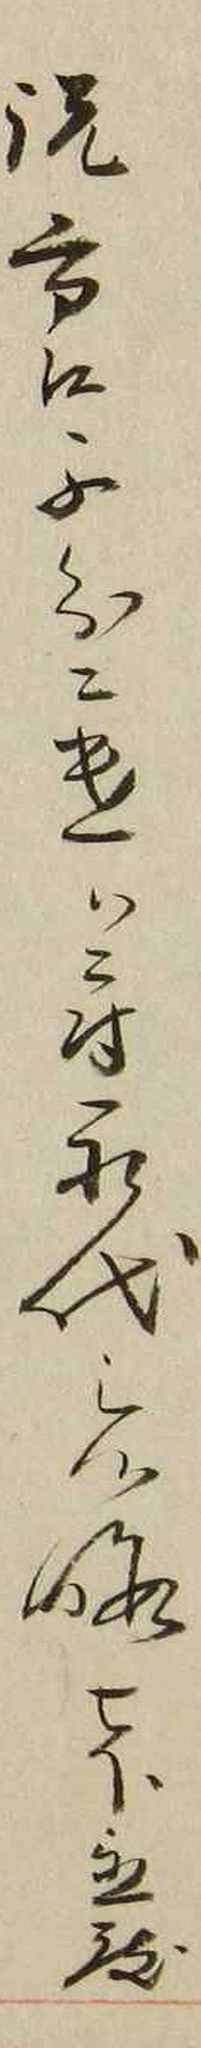祝方江不分遣候ニ付永代之御暇被下置致
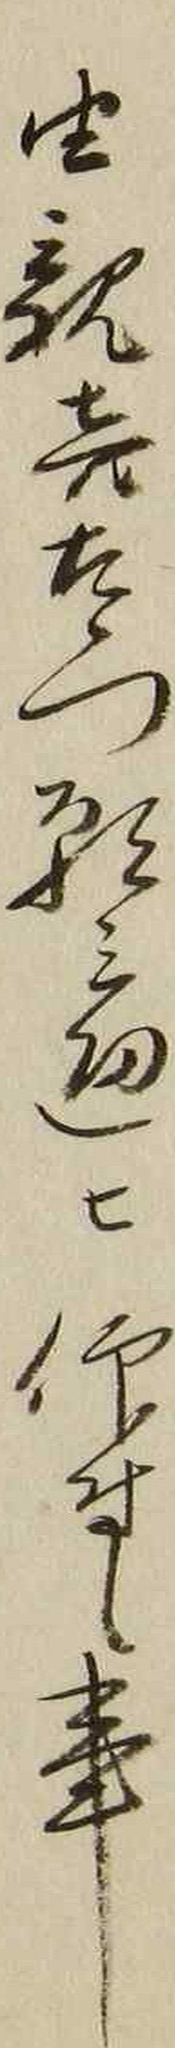由親左衛門願之通被仰付候事
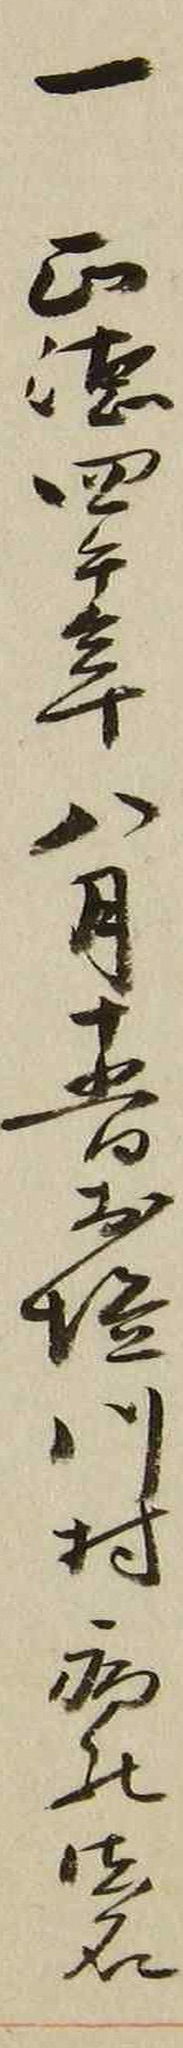一正徳四午年八月十五日於塩川村病死法名
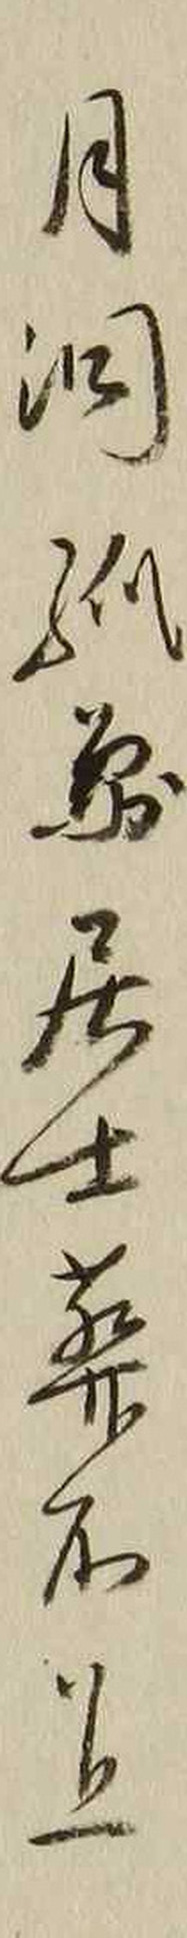月洞孤円居士葬所同上
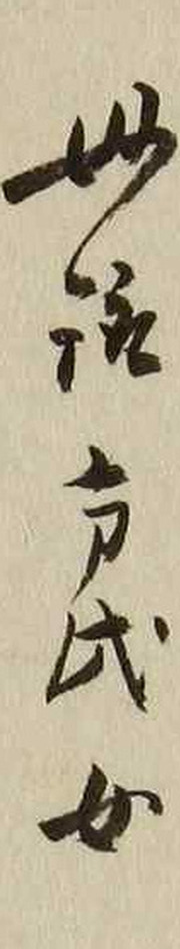母諏方氏女
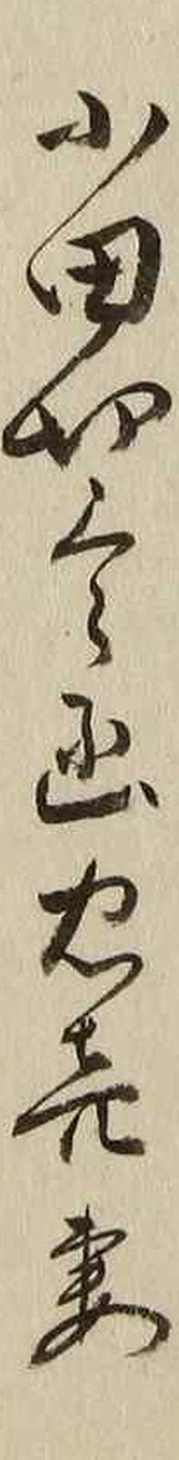女小田切三之丞忠喜妻
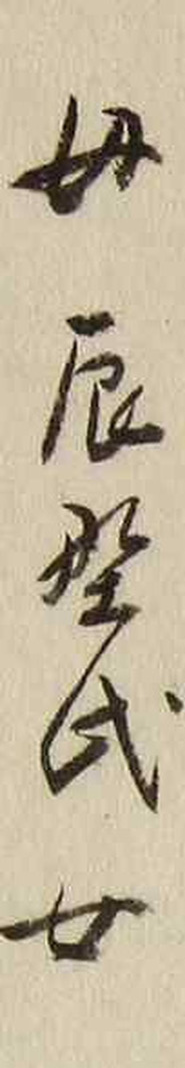母辰野氏女

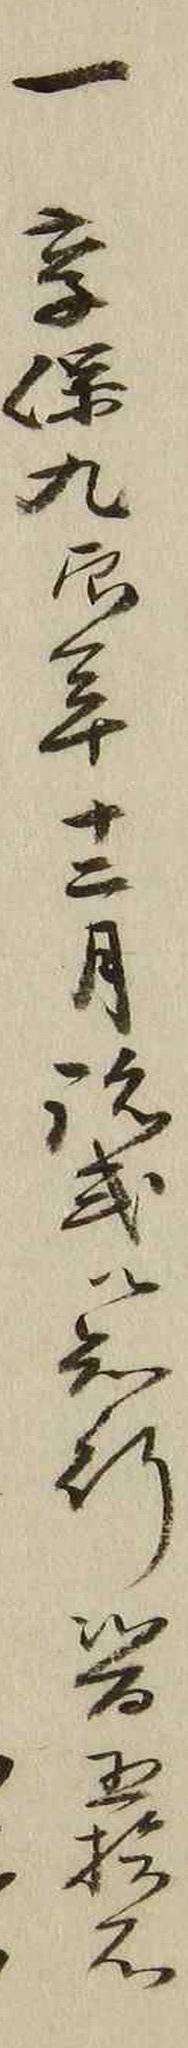一享保九辰年十二月跡式御知行弐百五拾石
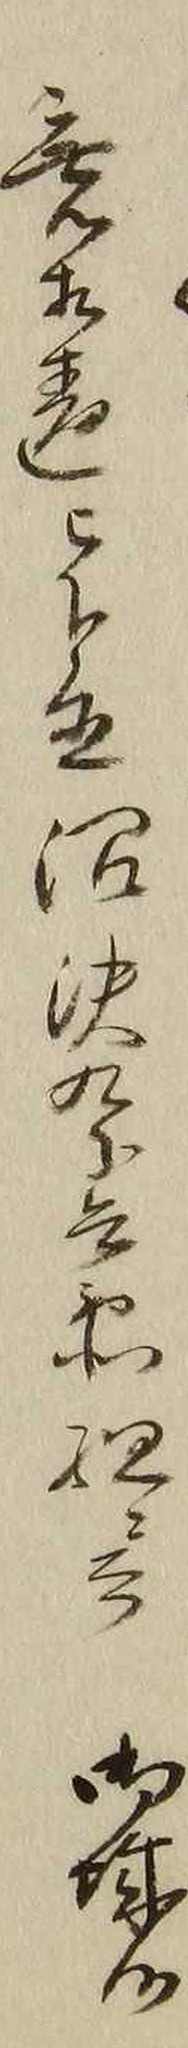無御相違被下置沼沢九郎兵衛組ニ而御城御
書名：諸士系譜　巻之311　し之部1
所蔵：会津若松市立会津図書館
